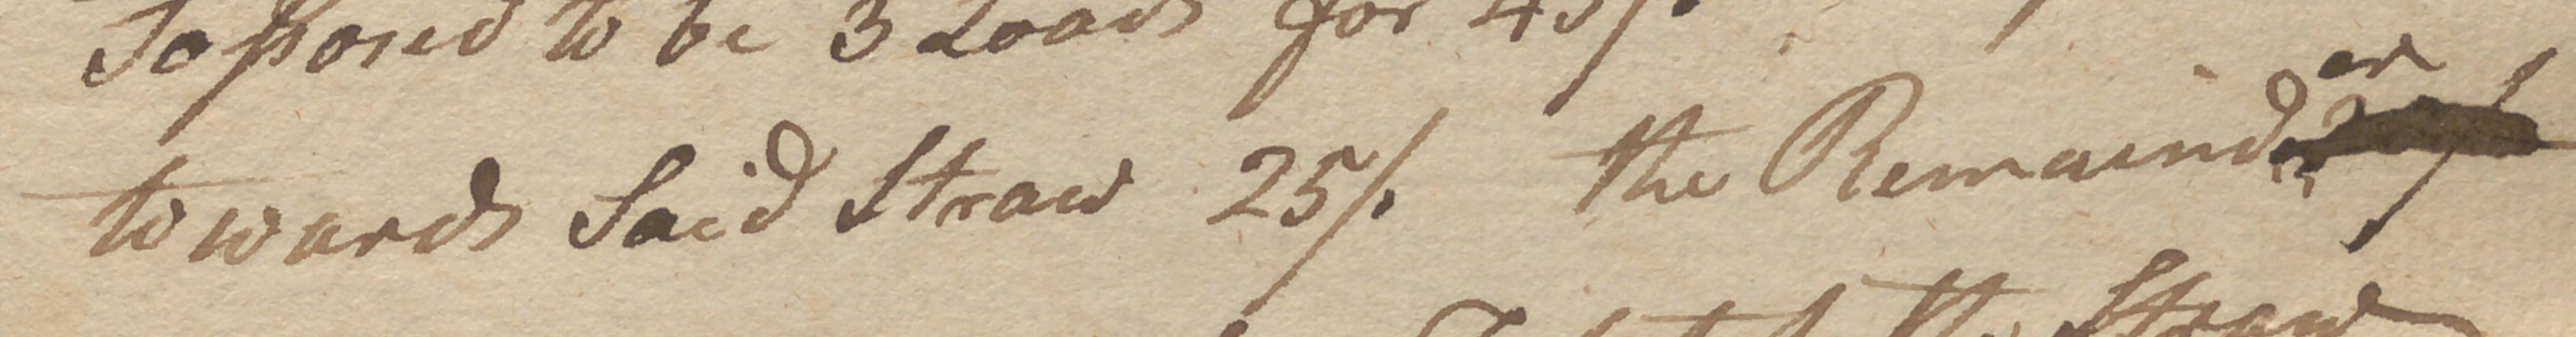towards Said Straw 25s. the Remaind^er [_____]
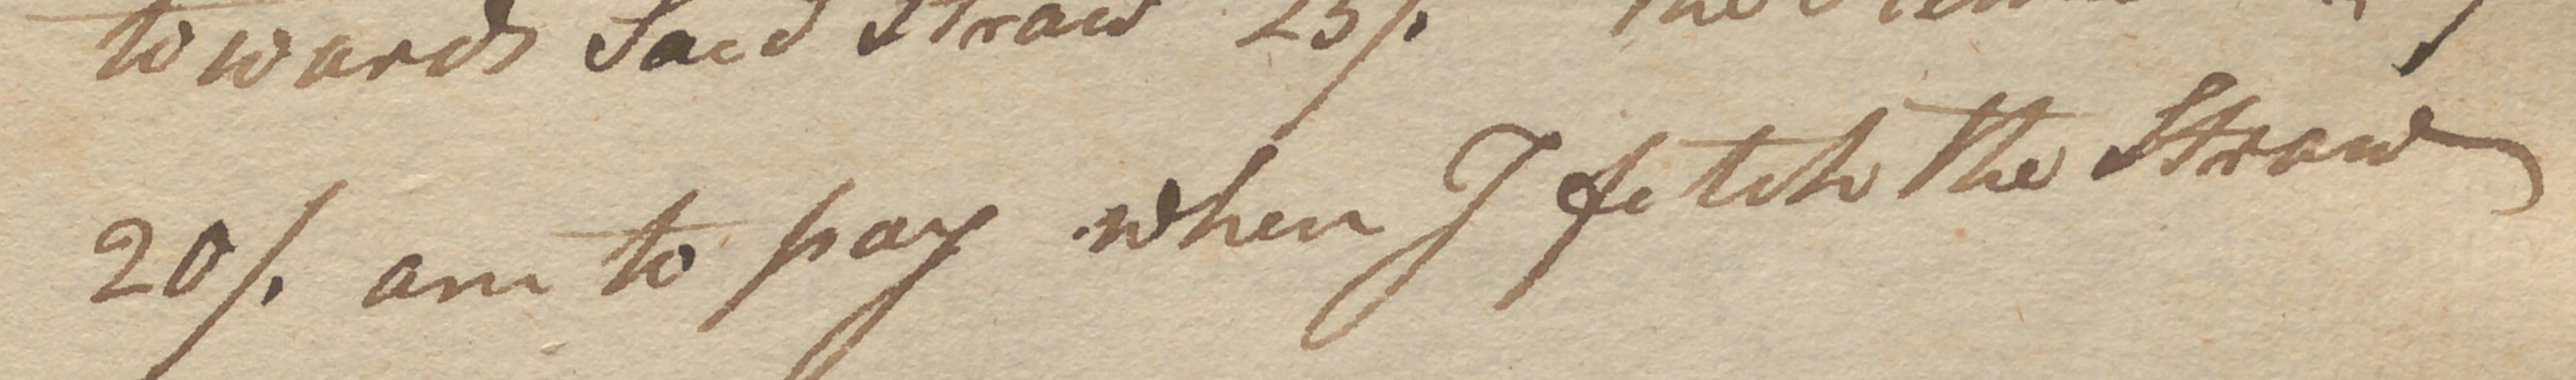20s. am to pay when I fetch the Straw
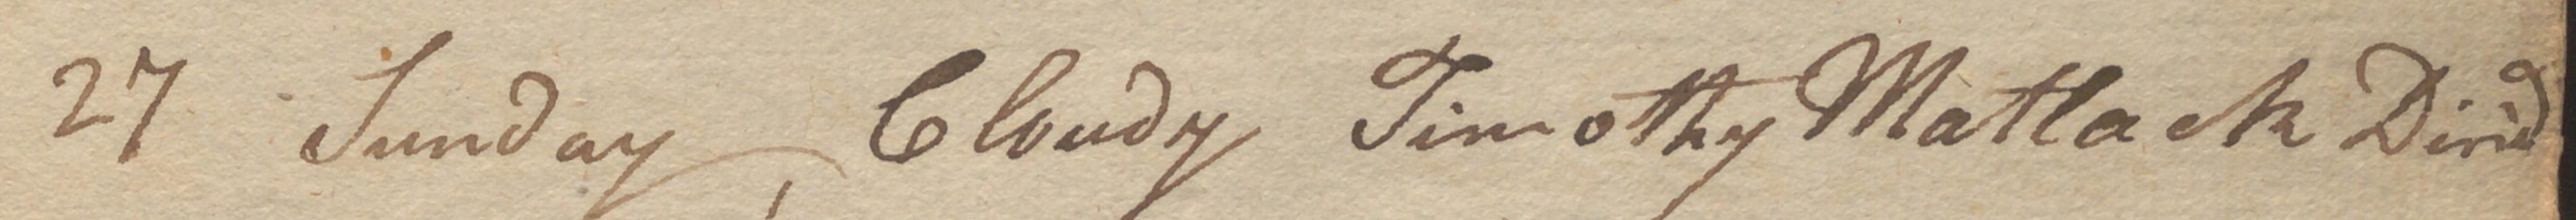27 Sunday Cloudy Timothy Matlack Din'd
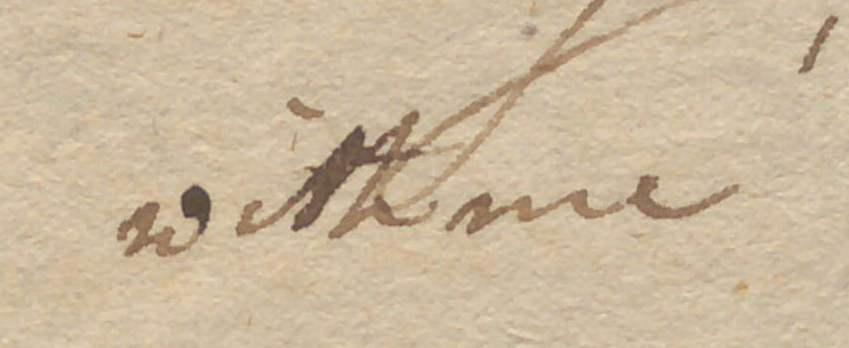with me
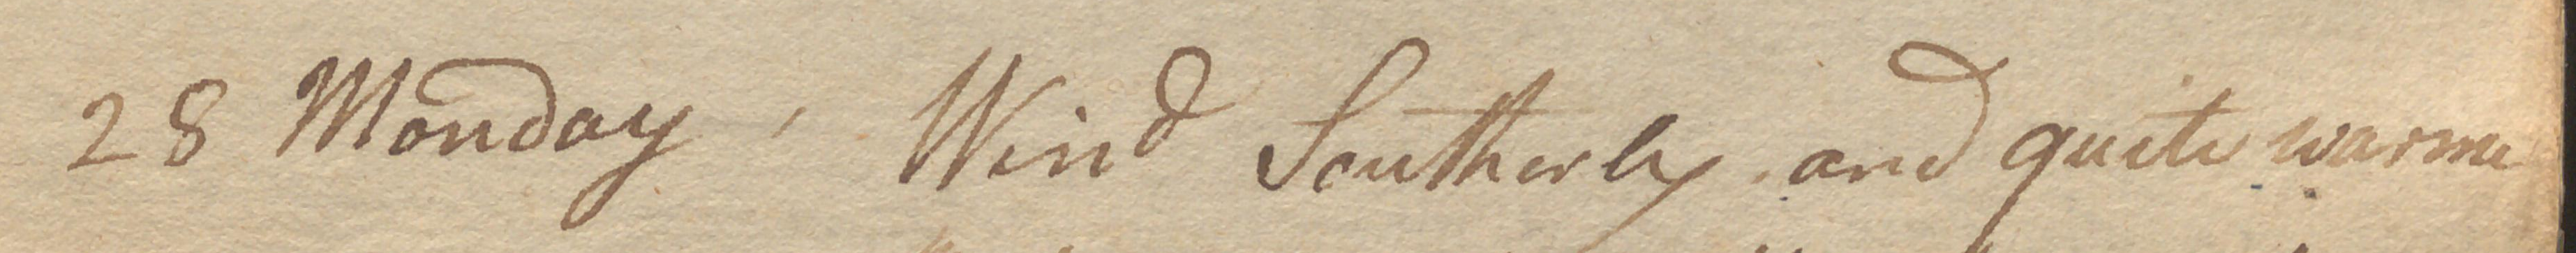28 Monday. Wind Southerly and quite warm
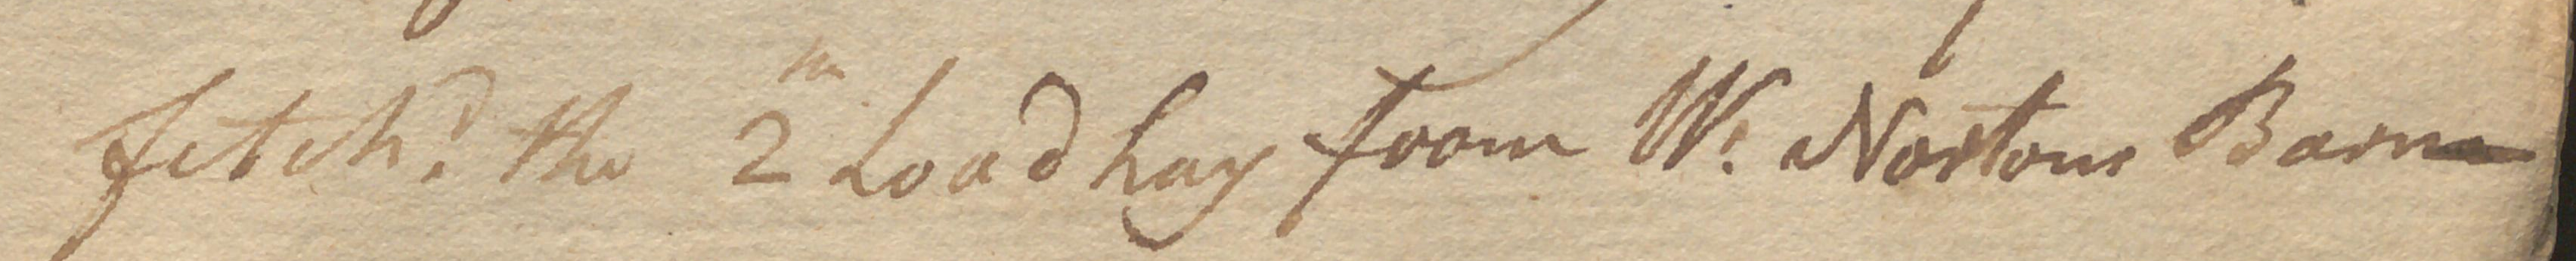fetch^d. the 2 Load hay foom W^r. Nortons Barn
